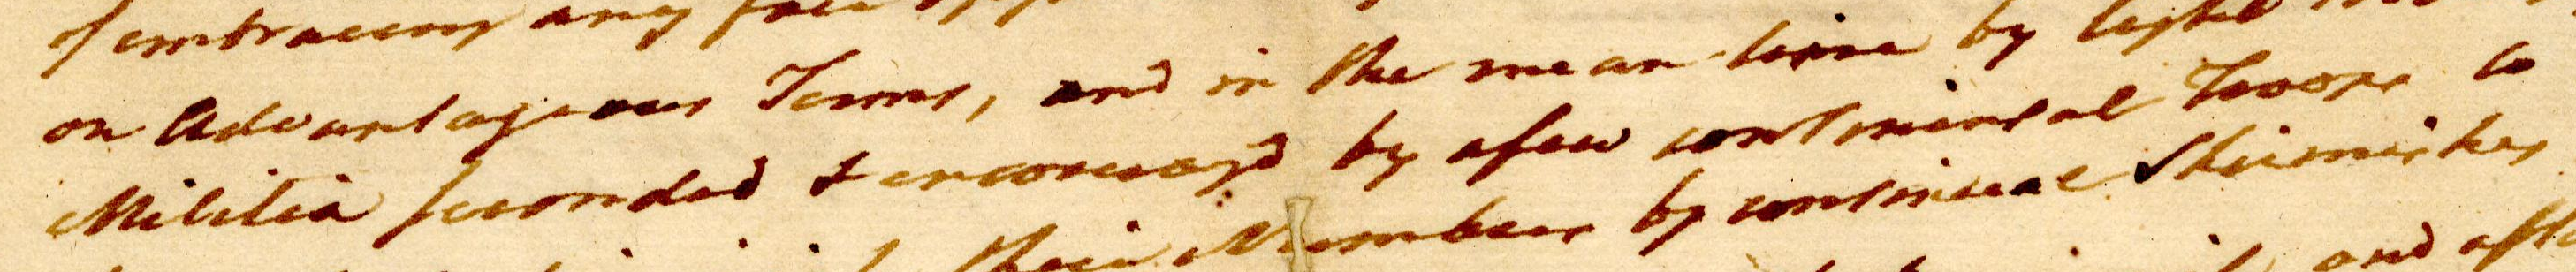Militia founded & encouraged by a few continental troops to
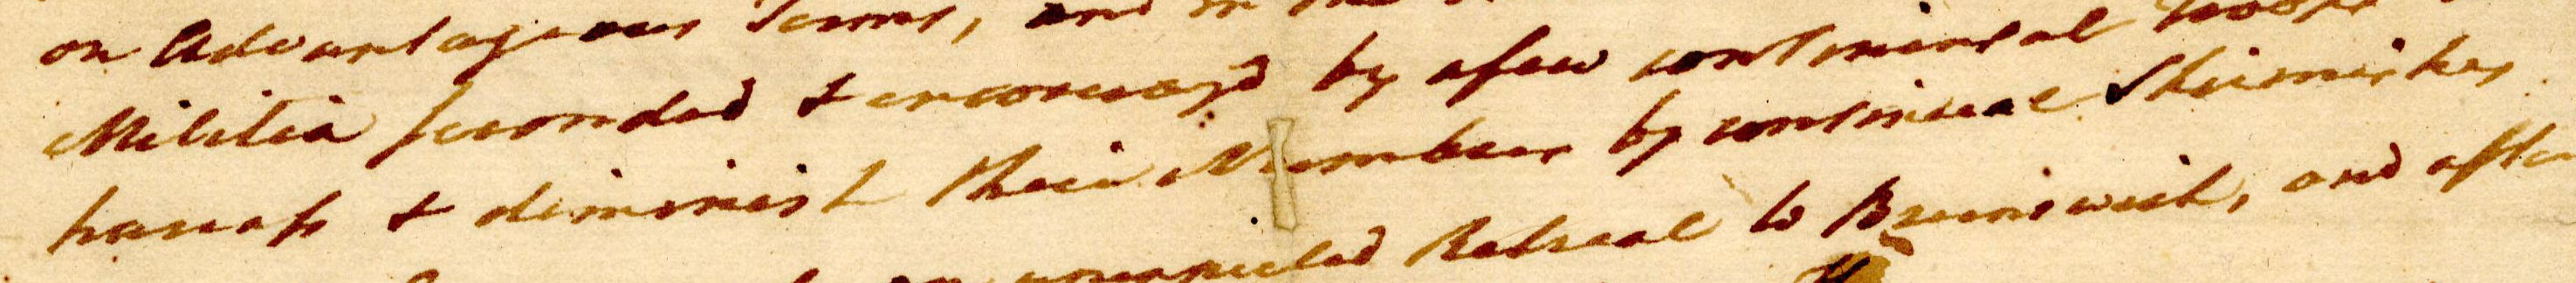harrass & diminish their number by continual Skirmishes.
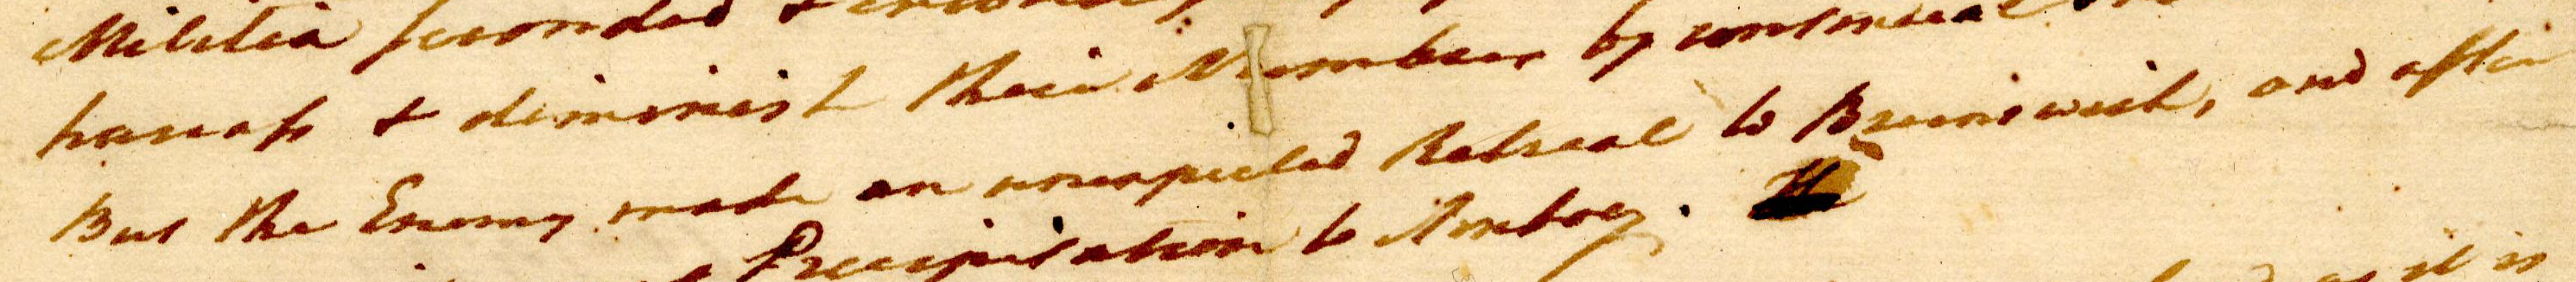But the Enemy made an unexpected Retreat to Brunswick, and after
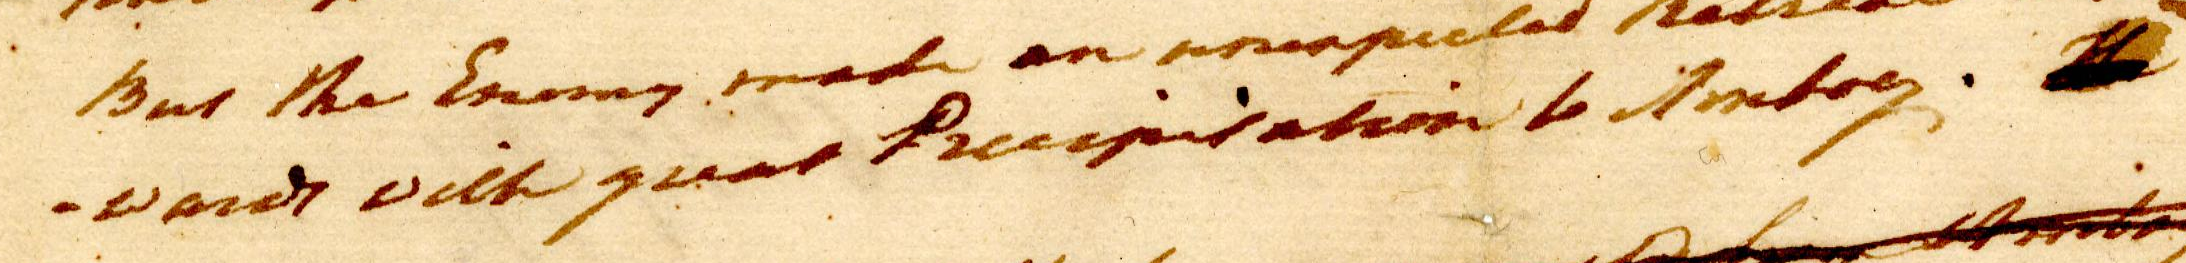-wards with great Precipitation to Amboy. [__]
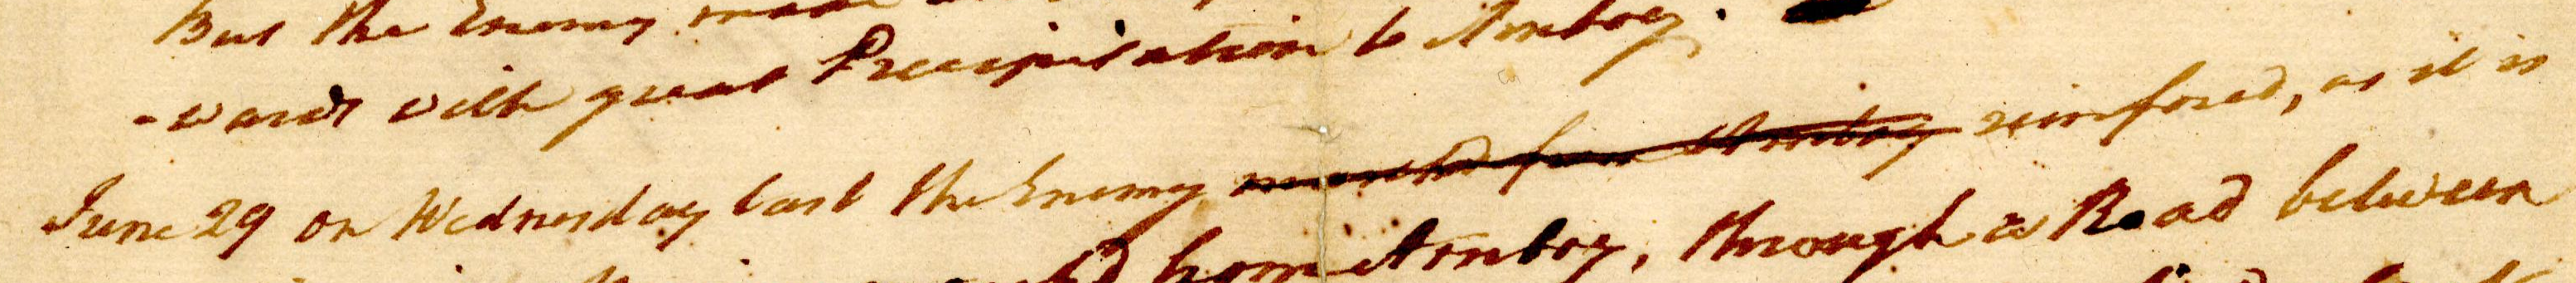June 29 on Wednesday last the Enemy [_______________] reinforced, as it is
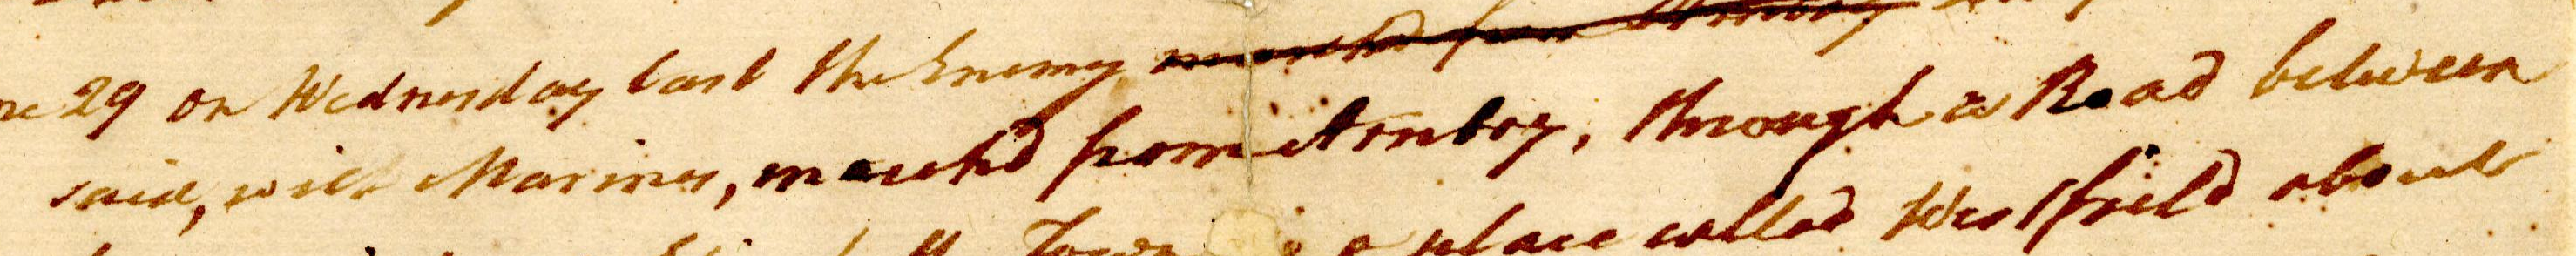said, with Marines, marched from Amboy, through a Road between
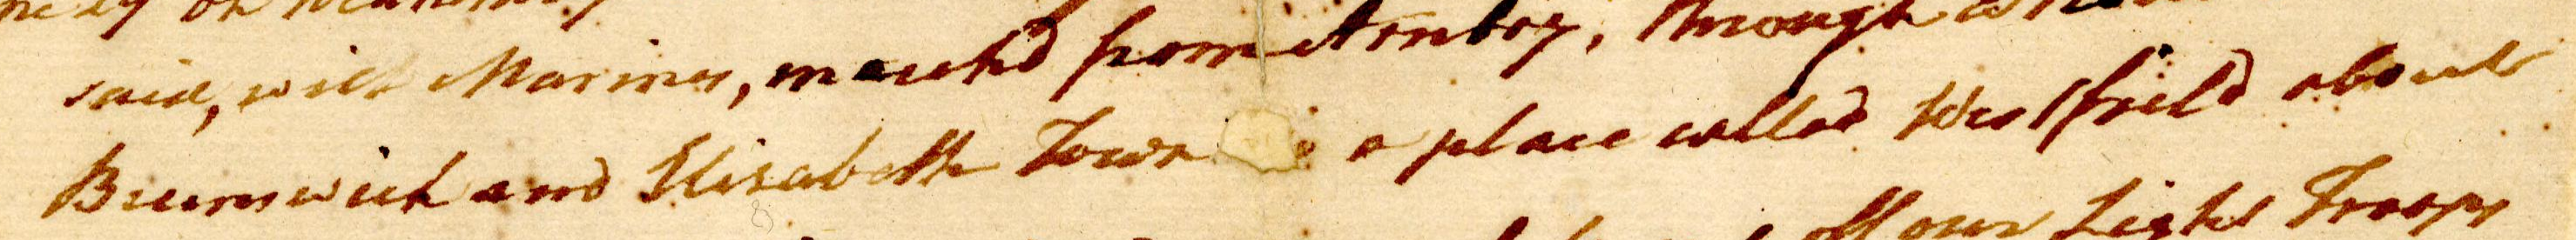Brunswick and Elisabeth Town a place called Westfield about
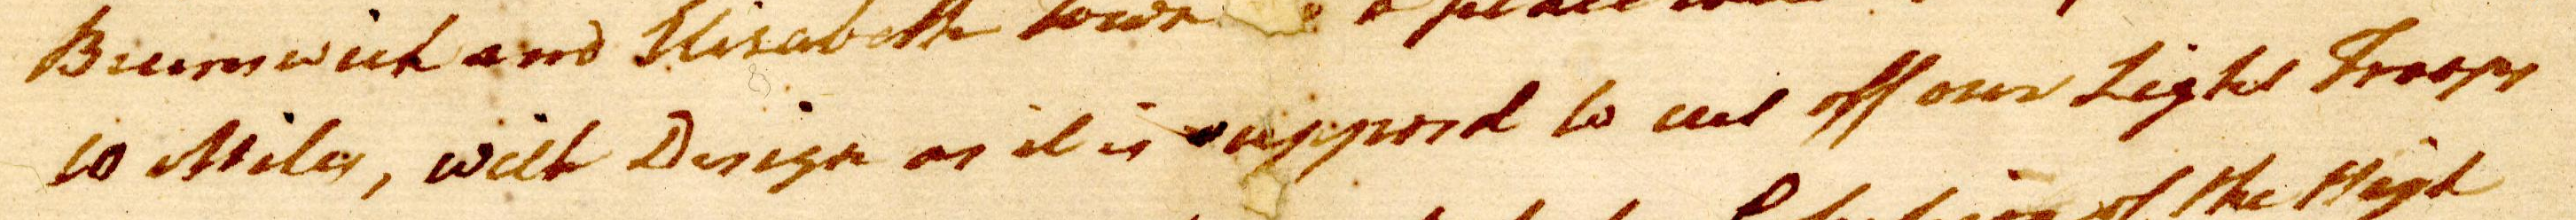10 Miles, with Design as it is supposd to cut off our Light Troops
